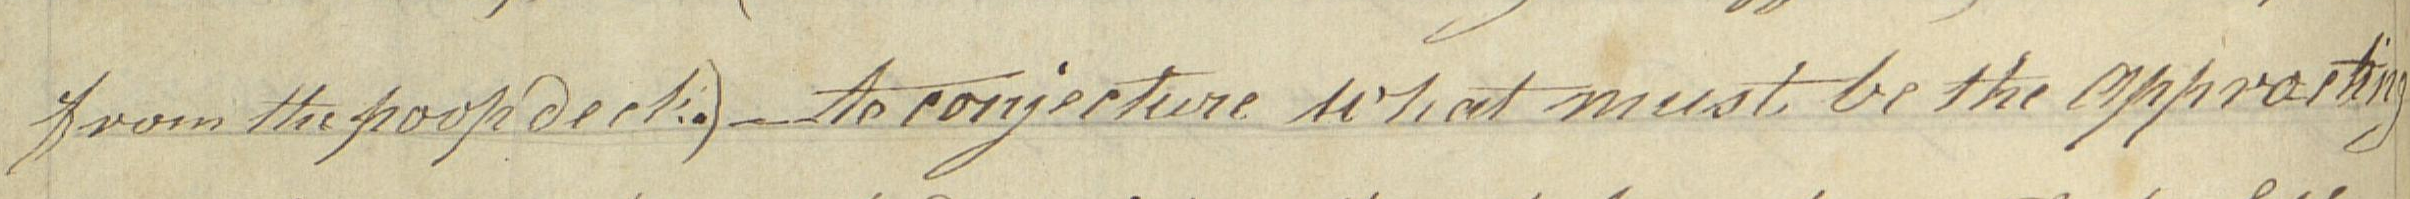from the poop deck.) to conjecture what must be the Apprasting
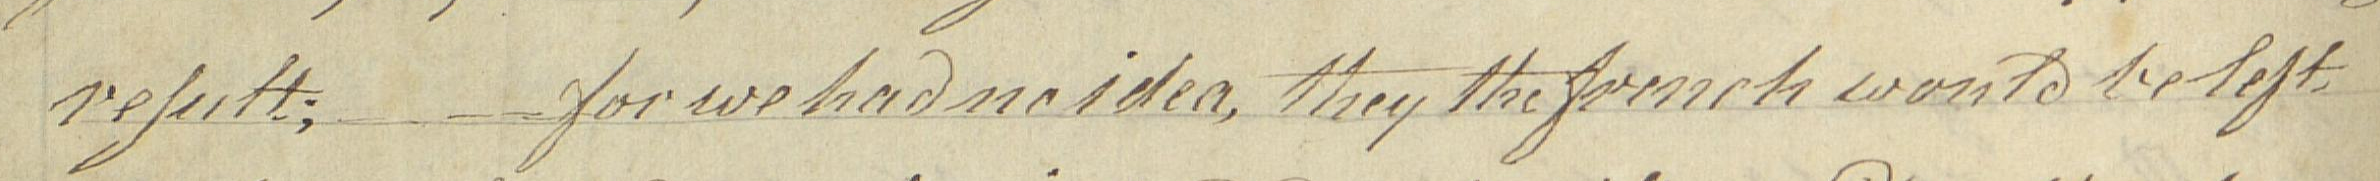result; for we had no idea, they the french would be left
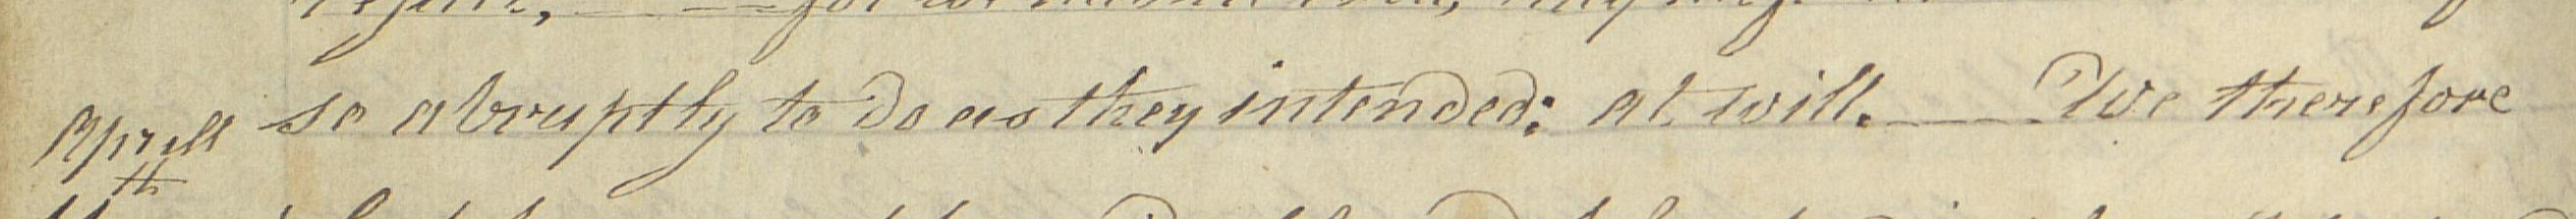Aprill so abruptly to do as they intended; at will. We therefore
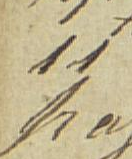11^th
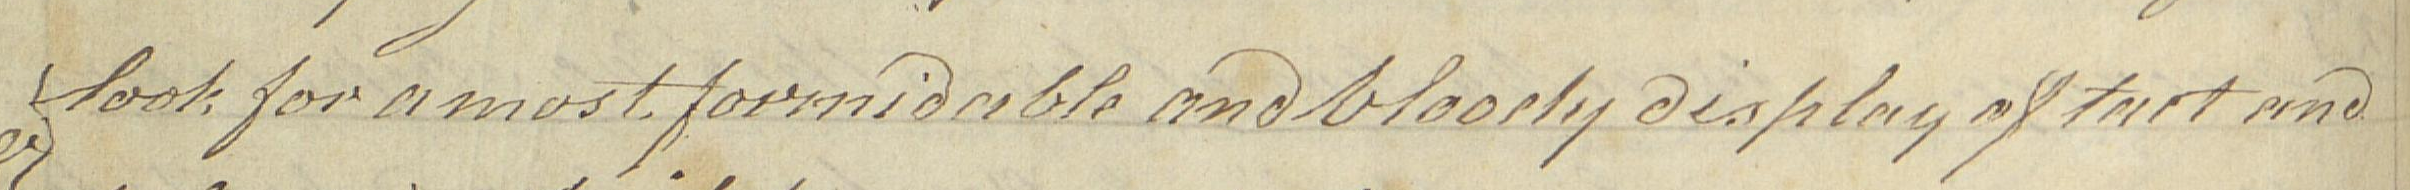look for a most formidable and bloody display of tact and
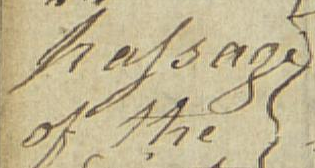passage
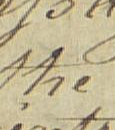of the
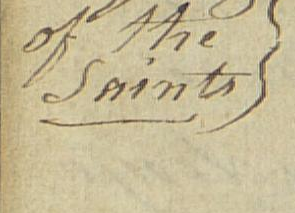Saints
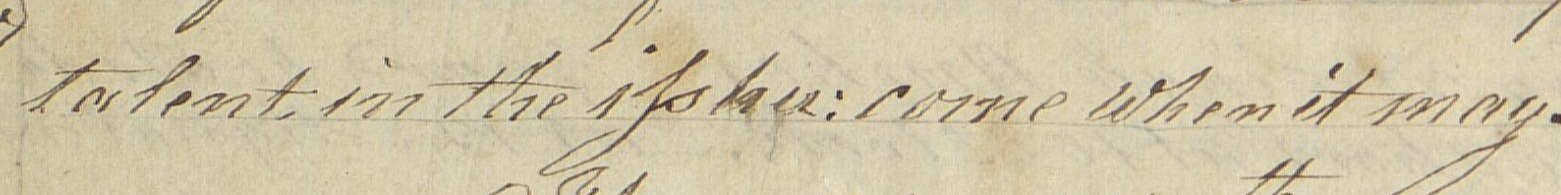talent in the issue: come when it may.
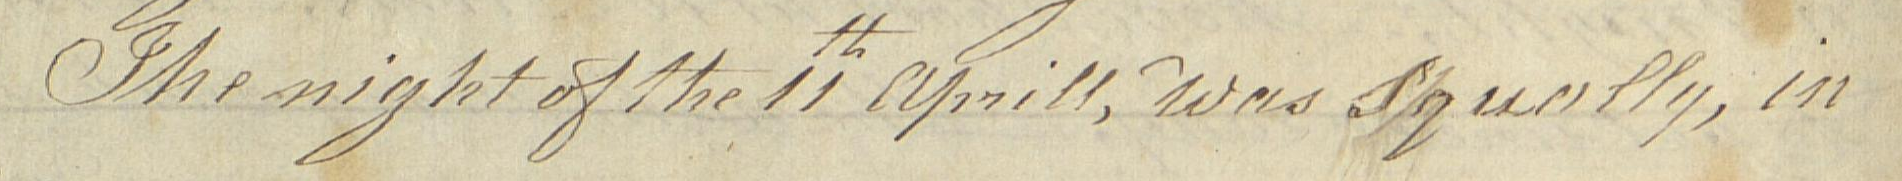The night of the 11^th Aprill, was Squally, in
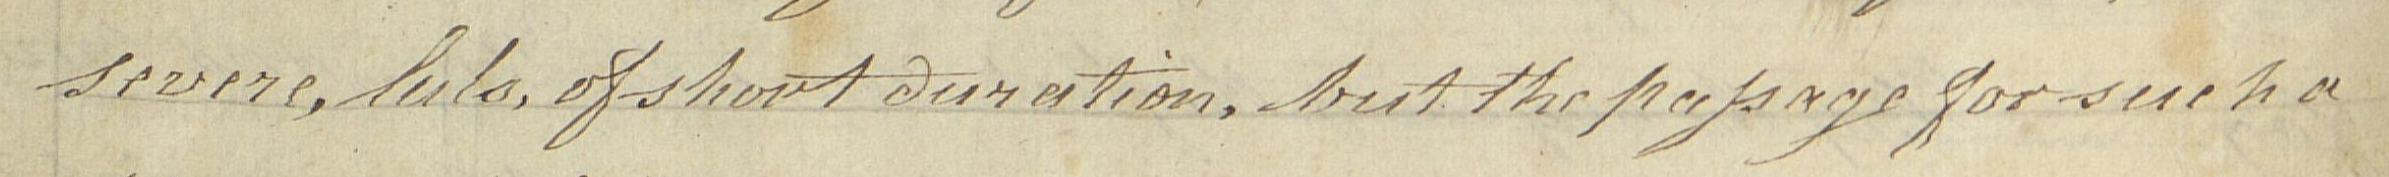severe, luls of short duration, but the passage for such a
